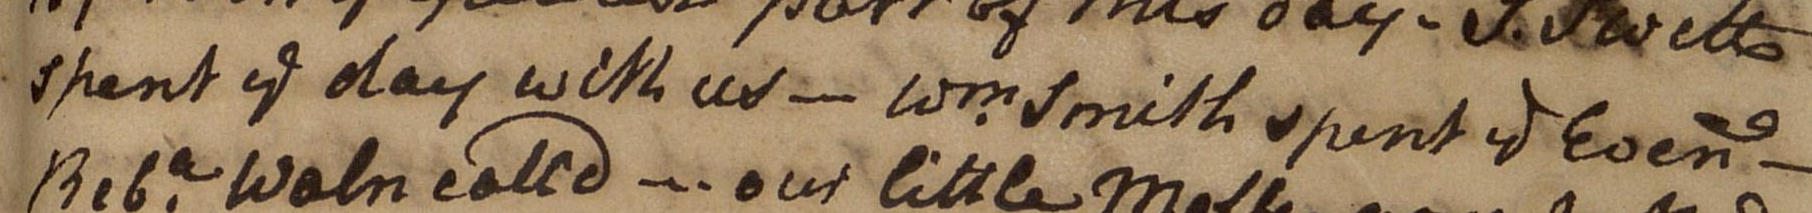spent y^e day with us- W^m. Smith spent y^e Even^g-
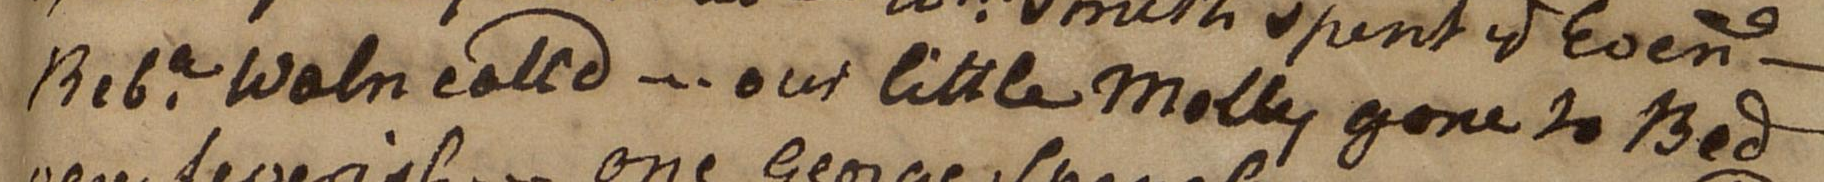Reb^a. Waln calld- our little Molly gone to Bed
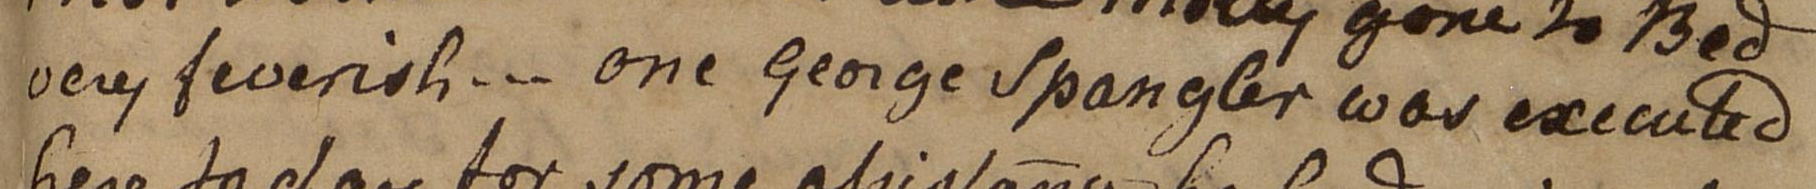very feverish-- one George Spangler was executed
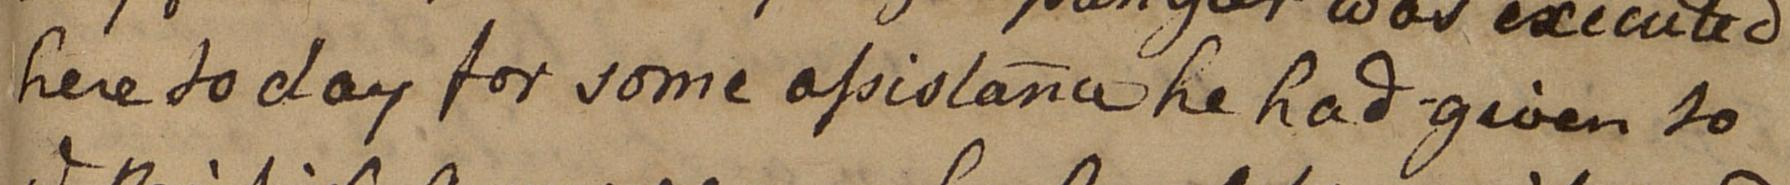here to day for some assistance he had given to
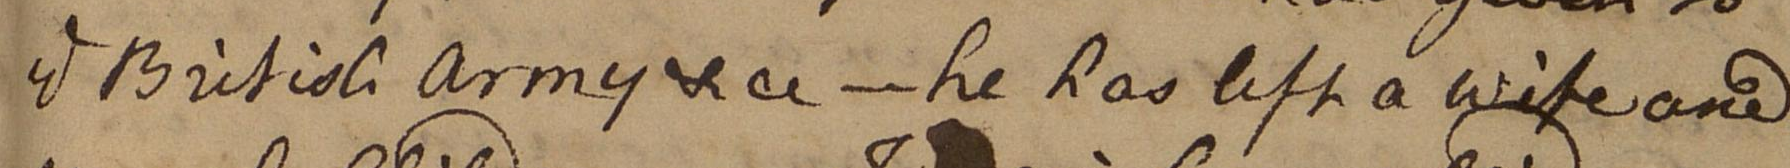y^e British Army &c -he has left a wife and
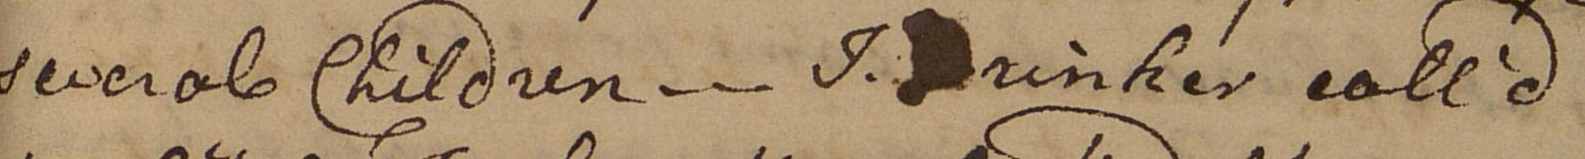several Children- J. Drinker call'd
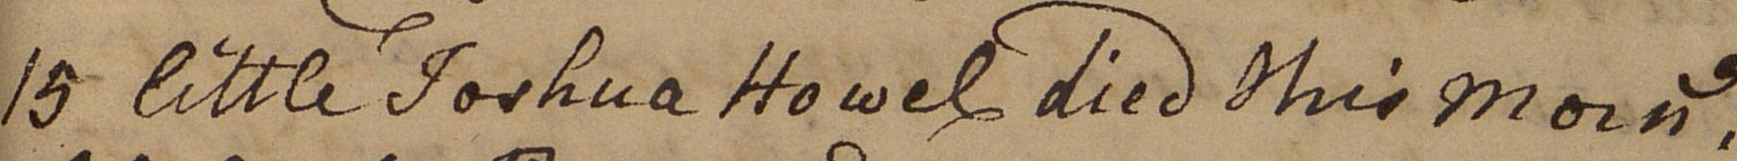15 little Joshua Howel died this Morn.^g
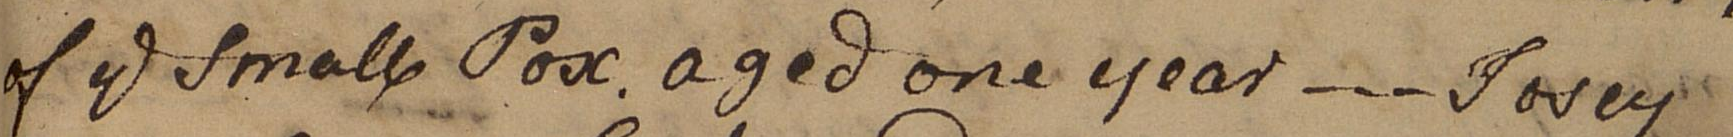of y^e Small Pox aged on year- Josey
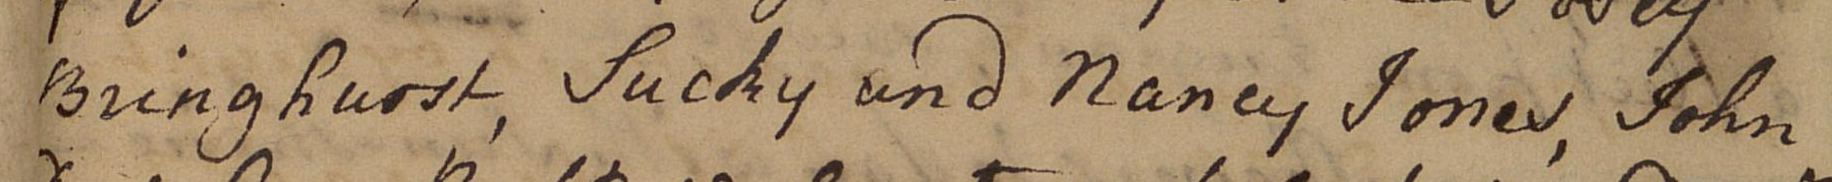Bringhurst, Sucky and Nancy Jones, John
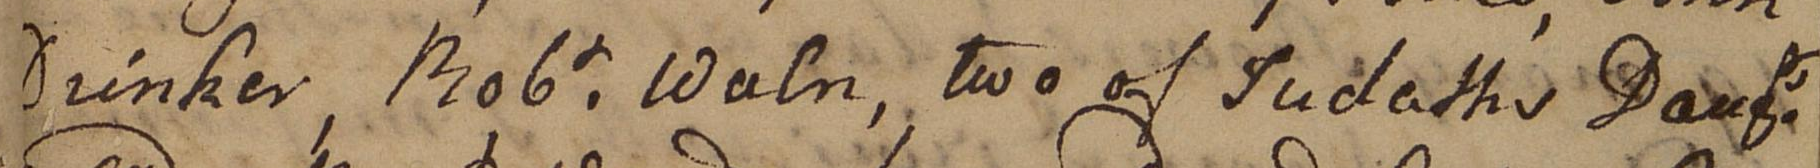Drinker, Rob^r. Waln, two of Judaths Daug^rs
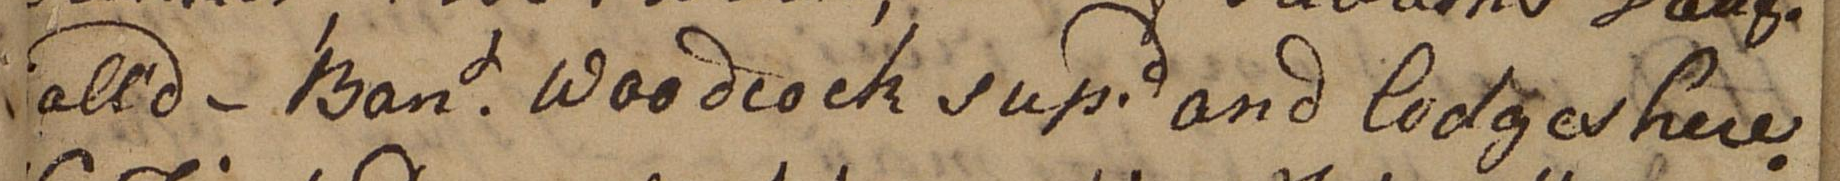all'd- Ban^t. Woodcock sup^d and lodges here.
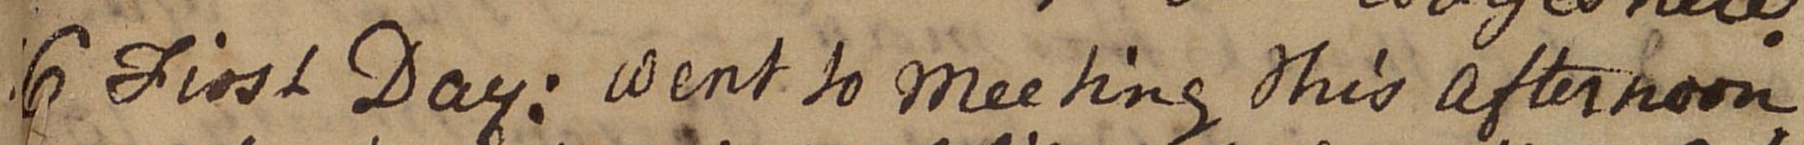6 First Day: went to meeting this afternoon,
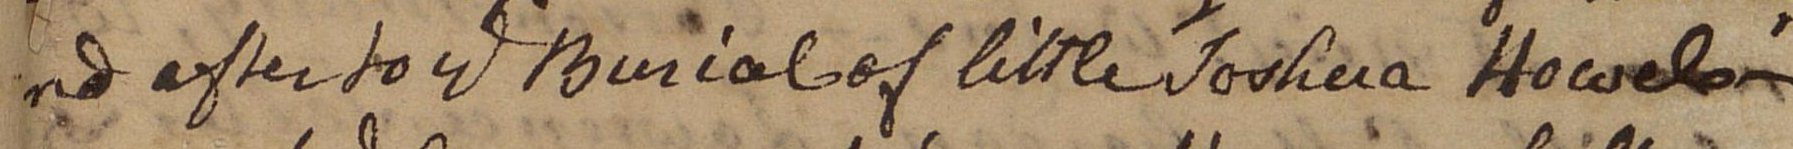nd after to y^e Burial of little Joshua Howel-
